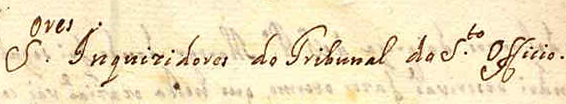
S.ores Inquizidores do Tribunal do S.to Officio.
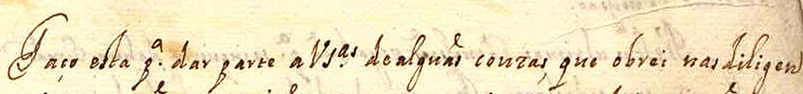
Faço ella p.a dar parte a V S.as de alguās couzas, que obrei nas diligen
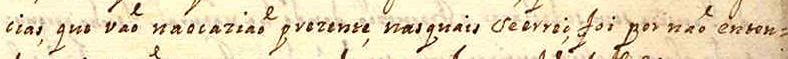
cias, que vaõ na ocaziaõ prezente, nas quais se errei, foi por naõ enten
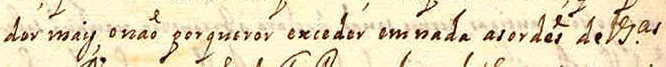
der mais, o naõ por querer exceder em nada as ordēs de V S.as
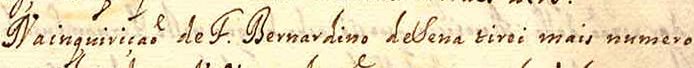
Na inquiriçaõ de F. Bernardino de Sena tirei mais numero
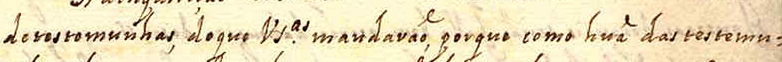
de testemunhas, do que V S.as mandavaõ, porque como huā das testemu
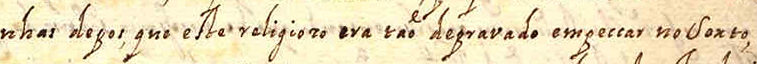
nhas depos, que este religiozo era tão depravado em peccar no Sexto,
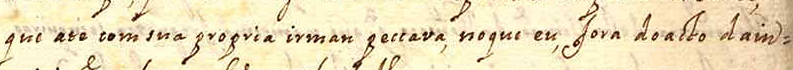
que ate com sua propria irman peccava, no que eu, fora do acto da in
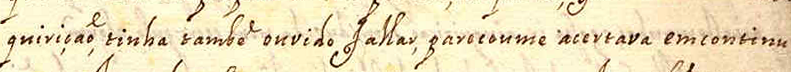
quiriçaõ, tinha tambē ouvido fallar, pareceume acertava em continu
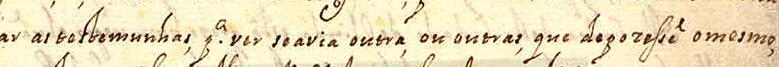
ar as testemunhas, p.a ver se avia outra ou outras, que depozessē o mesmo,
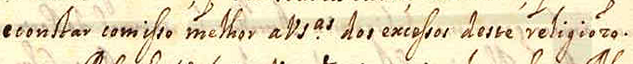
e constar com isso melhor a V S.as dos excessos deste religiozo.
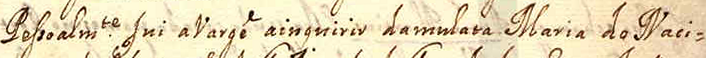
Pessoalm.te fui a Vargē a inquirir da mulata Maria do Naci
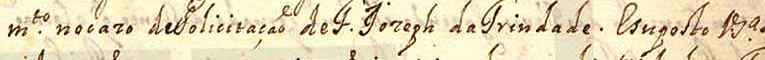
m.to no cazo de Solicitação de F. Iozeph da Trindade. E suposto V. S.as
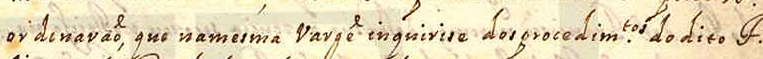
ordenavaõ, que na mesma Vargē inquirise dos procedim.tos do dito F.
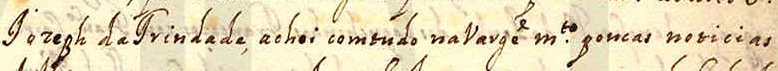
Iozeph da Trindade, achei comtudo na Vargē m.to poucas noticias
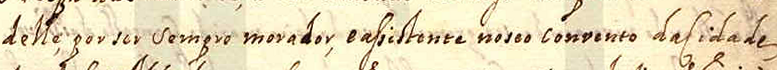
delle, por ser sempre morador, e assistente no seo convento da Cidade
